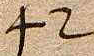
42
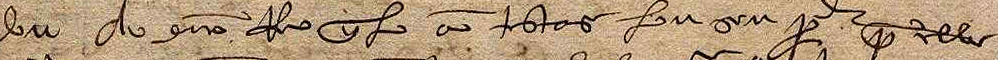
dou Ao dito Reo q̄ ho c̄otestase hou seu ꝓdor p̄o elle
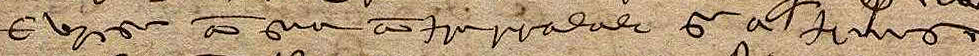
E vyese c̄o sua c̄otraryadade se a tyuese
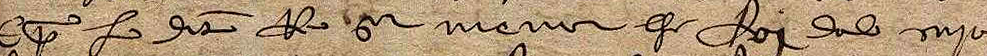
E p̄o ho dito Reo ser menor lhe foj dado cura
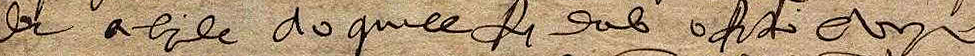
dor a lyde Ao quall foj dado o fejto e veyo
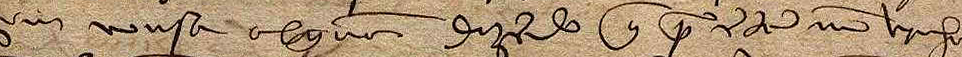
sem cousa algūa dizēdo q̄ p̄o ētā nō vynha
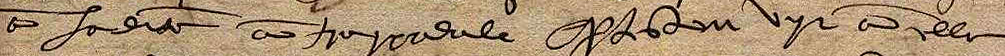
c̄o ha dita c̄otraryadade e ꝓtestou vyr c̄o ella
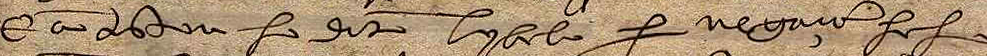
E c̄otestou ho dito lybelo ꝑ negaçā he ho
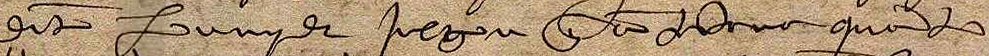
dito houuydor Julgou q̄ c̄otestaua quāto
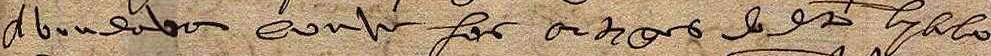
Avondava e ouve hos artygos do dtō lybelo
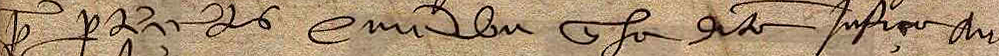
p̄o ꝑtēcētes e mādou q̄ ha dita Justiça Au
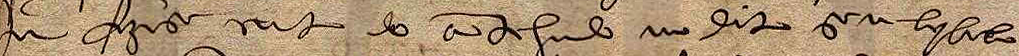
tor fizese certo do c̄otehudo no dito seu lybelo
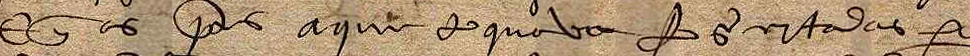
E q̄ as p̄tes a que toquava fosē cytadas ꝑa
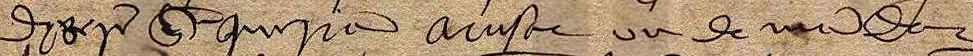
dyzerē se queriā acusar ou demādar
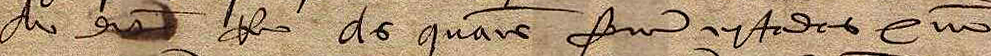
Ao dito Reo As quaes forā cytadas e nō
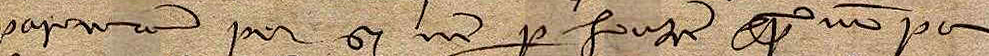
parecerā per sy nē ꝑ houtrē e p̄o nō pa
